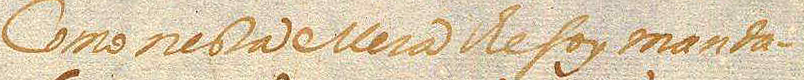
Como nesta Meza lhe foy manda
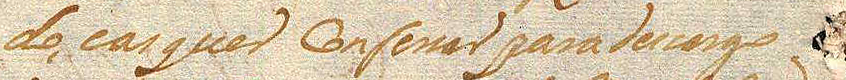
do, e as quer confessar para descargo
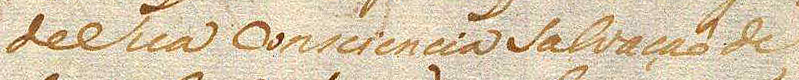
de sua consciencia salvaçaõ de
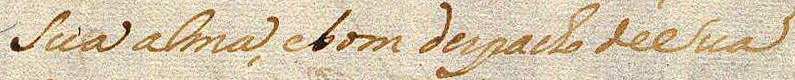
sua alma, e bom despacho de sua
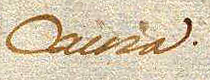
cauza.
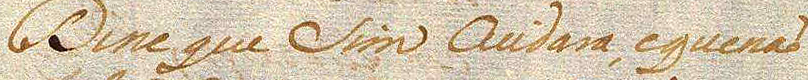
Disse que sim cuidara, e que naõ
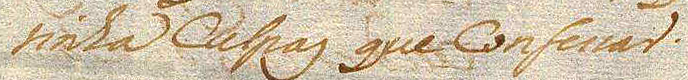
tinha culpas que confessar.
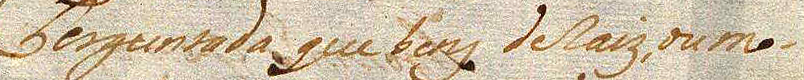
Perguntada que bens de Raiz, ou mo
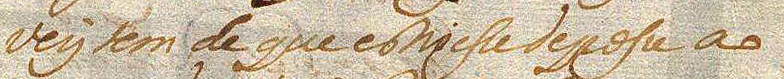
veis tem de que estivesse de posse ao
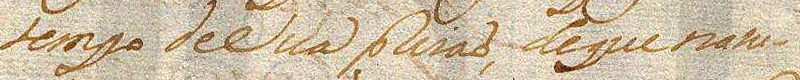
tempo de sua prizaõ, de que natu
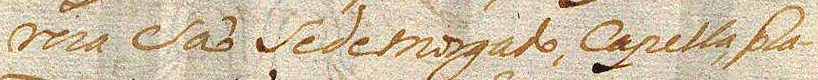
reza saõ se de morgado, capella, pra
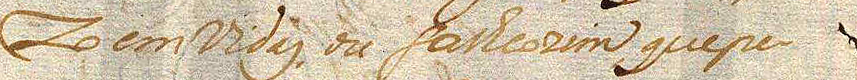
Zo em vidas, ou fatheozim, que pe
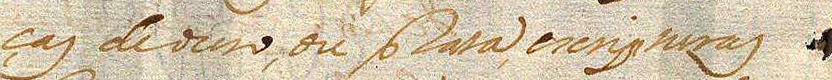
ças de ouro, ou prata, escripturas
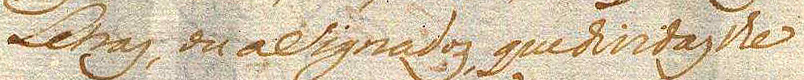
Letras, ou asignadoz, que dividas lhe
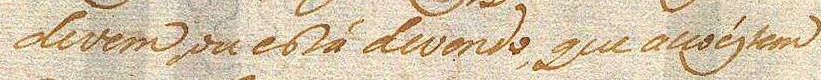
devem, ou está devendo, que accoẽs tem
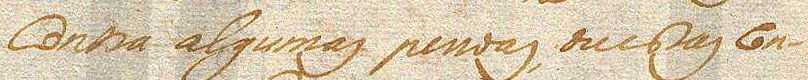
contra algumas pessoas, ou estas con
